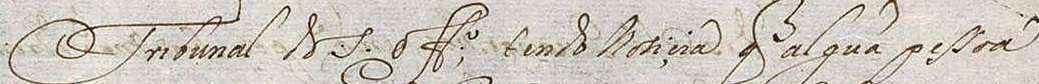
Tribunal do S. off.o; tendo notiçia q̄ alguā pessoa
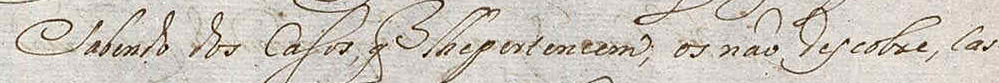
sabendo dos casos, q̄ lhe pertencem; os não descobre, cas
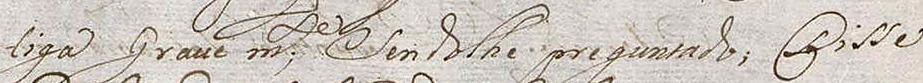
tiga Grauem.te sendolhe preguntado; Disse
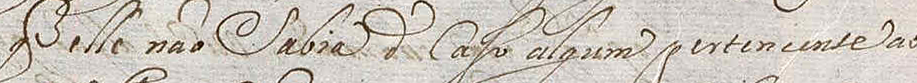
q̄ elle não Sabia d Caso algum pertencente ao
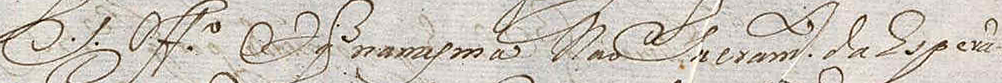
.S. Off.o E q̄ na mesma Nao Sacramto. da Esperā
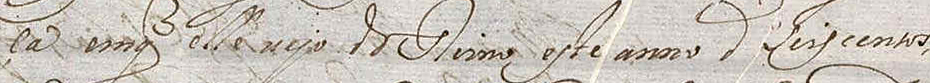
ça em q̄ elle vejo do Reino este anno d seiscentos,
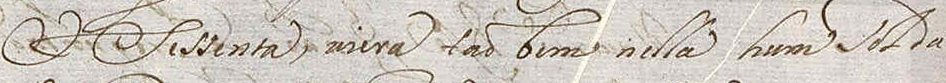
E Sessenta, viera taõbem nella hum Solda
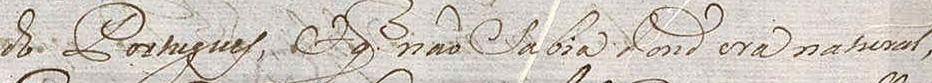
do Portugues, E q̄ não sabia dond era natural,
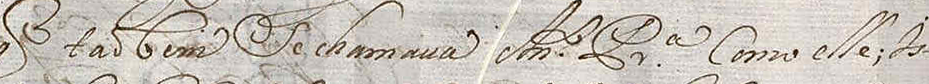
q̄ taõbem se chamava An.to Pr.a Como elle; Is
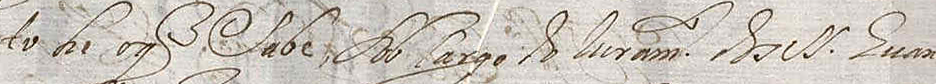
to he o q̄ Sabe, Sob Cargo do Juram.to dos SS. Euan
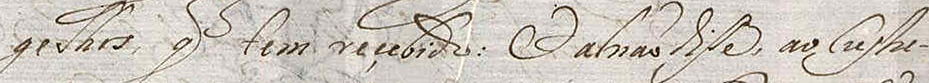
gelhos, q̄ tem reçebido: E al naõ disse, ao Custu
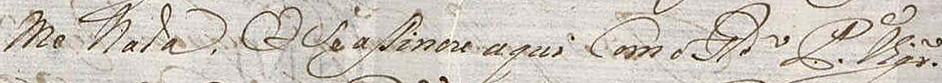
me Nada, E se assinou aqui Com o Rdo P.e Vigr.o
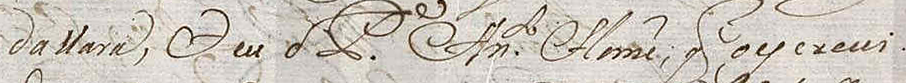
da uara, E eu o P.e An.to Homē; q̄ o escreui
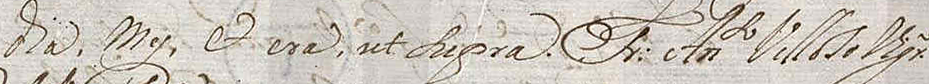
dia, mes, E era, ut supra. Fr: Anto Velloso Vigro
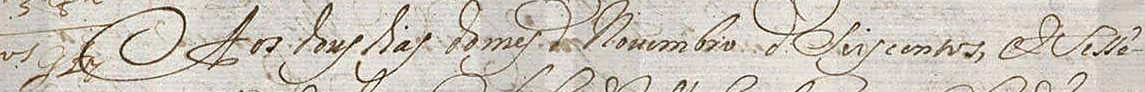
Aos dous dias do mes d Nouembro d Seiscentos, E sessē
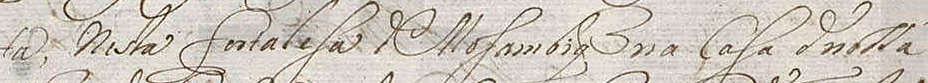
ta, Nesta fortalesa d Mosambiq̄ na Casa d nossa
